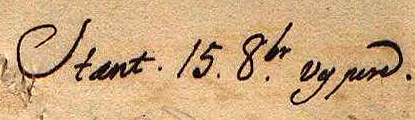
stant. 15. 8.br vesper.
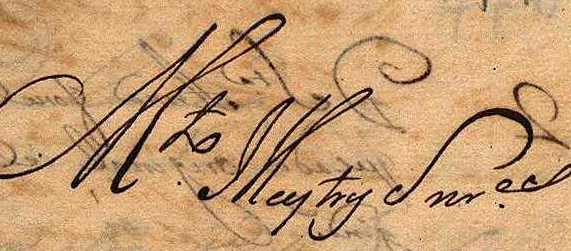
M.to Illustres Snr.es
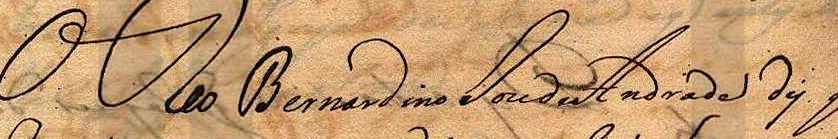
O Reo Bernardino Ioze de Andrade dis q̄
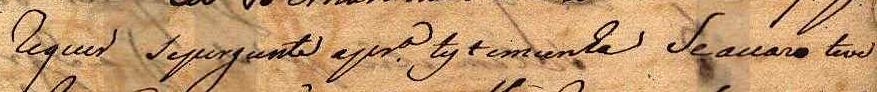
Requer se pergunte a pr.a testemunha Se accazo teve
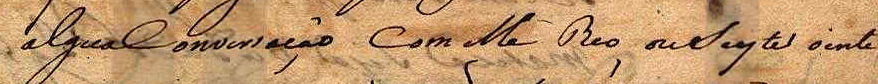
algua Conversaçaõ Com elle Reo, ou Se este o inte
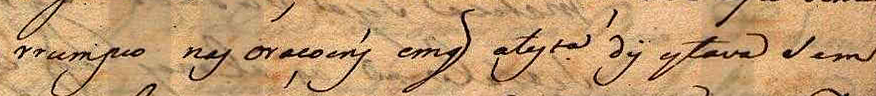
rrumpeo nas oraçoen̄s em q̄ a testa. dis estava sem
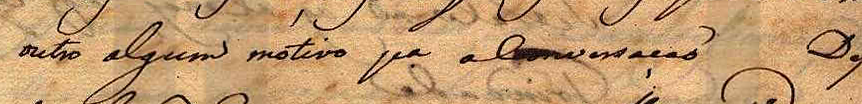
outro algum motivo pa a Comversaçaõ Dis
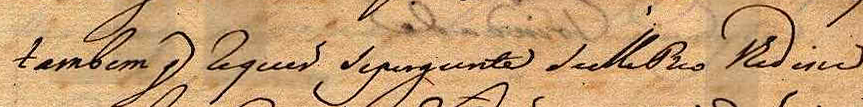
tambem q̄ Requer se pergunte se elle Reo lhe disse
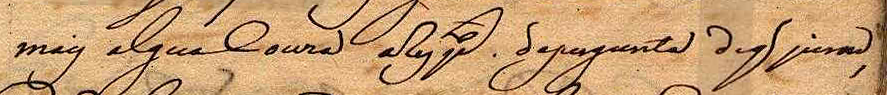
mais algua Couza a Respto. de pergunta de q̄ jurar,
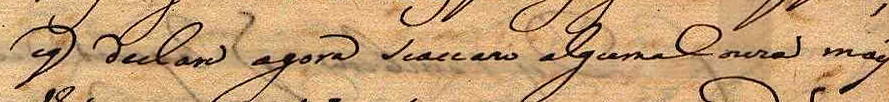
e q̄ declara agora se accazo alguma Couza máes
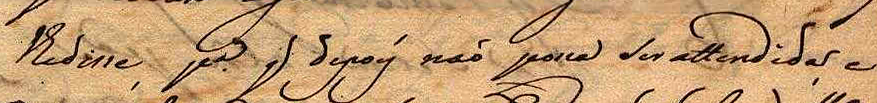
lhe disse, p.a q̄ depois naõ possa ser attendida, e
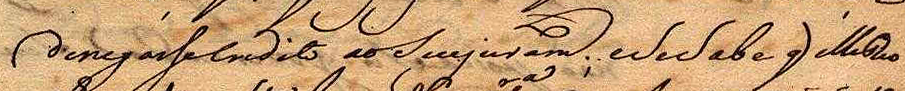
de negarse credito ao Seu juram.to, e se sabe q̄ elle Reo
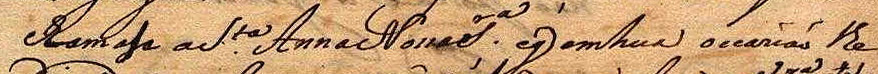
chamase a S.ta Anna Nossa Sra. e q̄ em hua occaziaõ lhe
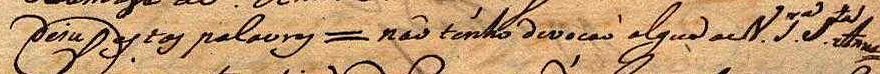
disse estas palavras = naõ tenho devoçaõ algua a N. Sra. S.ta Anna
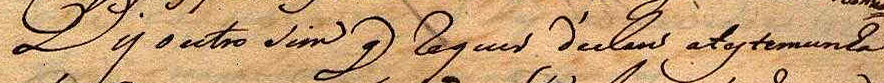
Dis outrosim q̄ Requer declare a testemunha
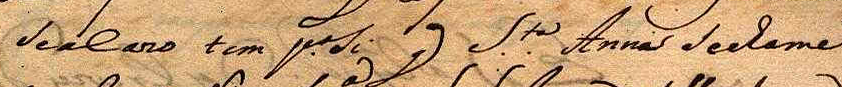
se aCazo tem p.a si q̄ S.ta Anna se chame
